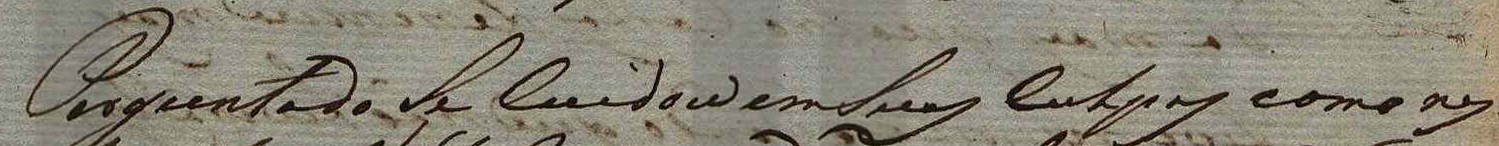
Perguntado Se Cuidou em Suas Culpas como nes
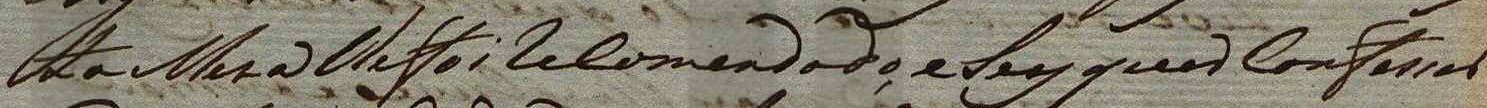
ta Meza lhe foi ReComendado, e Se as quer Confessar
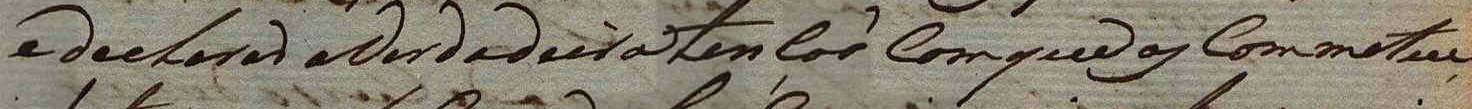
e declarar a Verdadeira tenÇaõ Com que as Commeteu
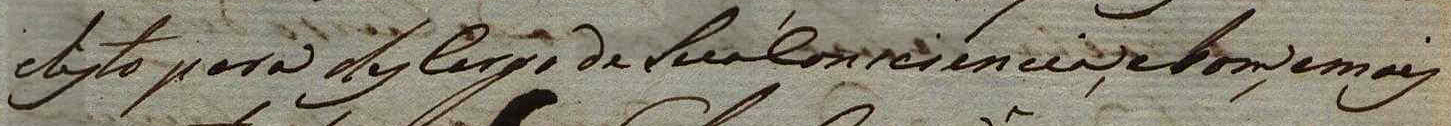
e histo para desCargo de Sua Consciencia, e bom, e mais
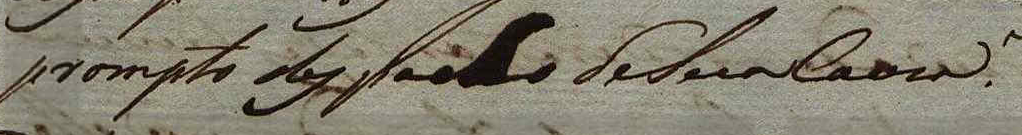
prompto despacho de Sua Cauza.
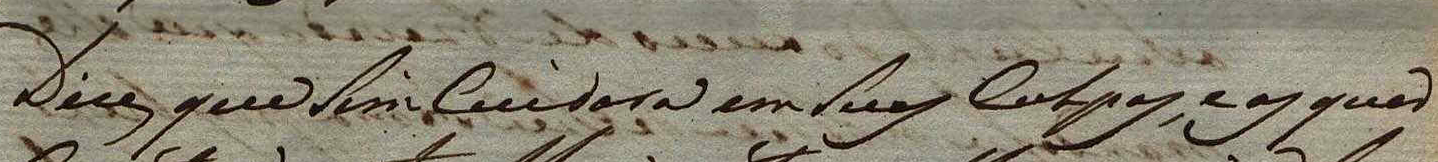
Dice que Sim Cuidara em Suas Culpas, e as quer
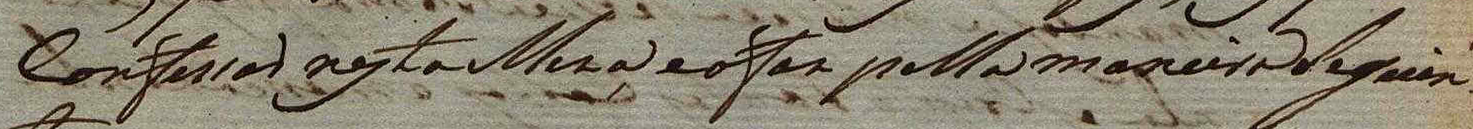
Confessar nesta Meza, e o faz pella maneira Seguin
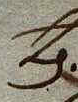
te.
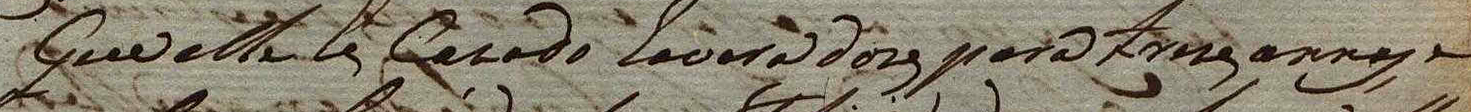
Que elle he Cazado havera doze para treze annos, e
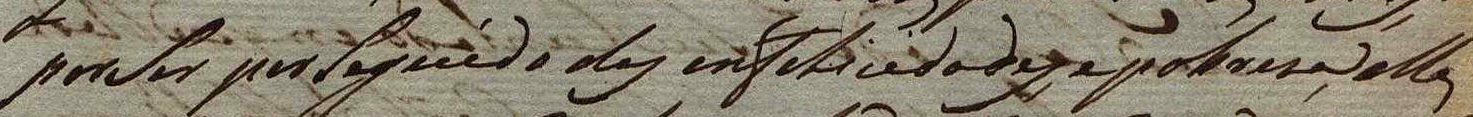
por Ser perSeguido das enfelicidades, e pobreza, elle
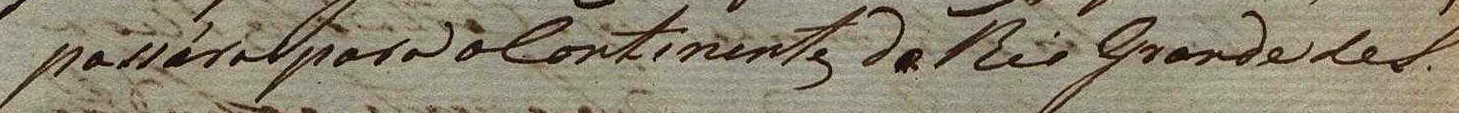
passára para o Continente do Rio Grande de S.
